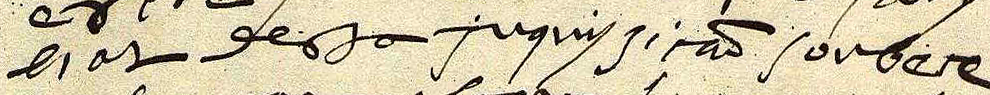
liar desta jnquyziçaõ soubeçe
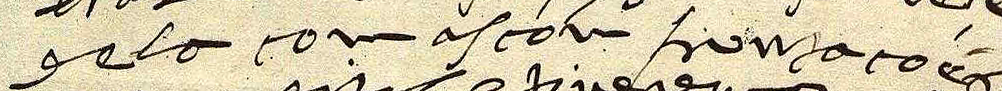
dela com as comfrontaçoẽs
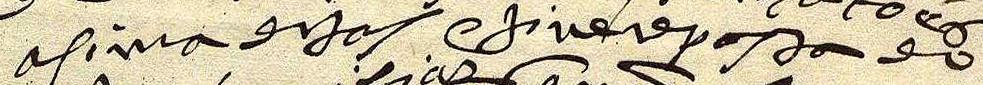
asima ditas e tiue reposta do
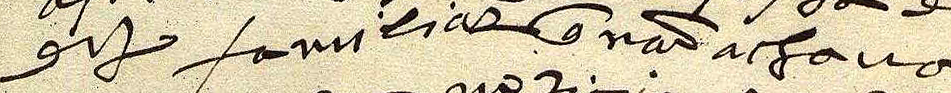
dito familiar q̄ naõ achaua
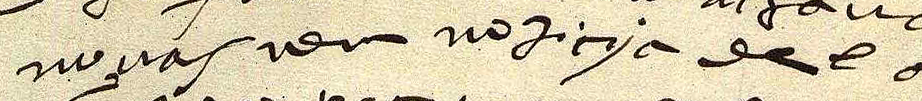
nouas nem noticya dela
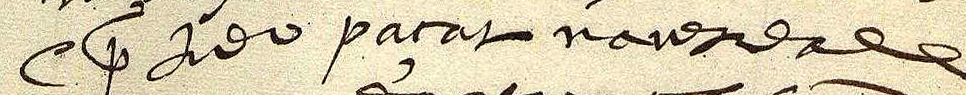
e p̄o tudo paçar na uerdade
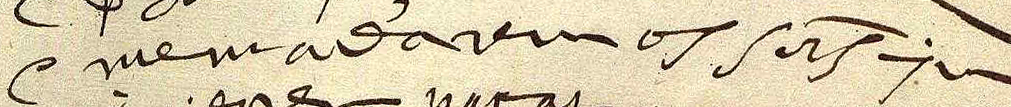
e me madarem os sor̄s jn
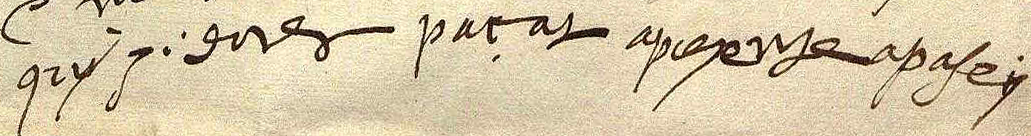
quyzidores paçar a prezente a pasey
